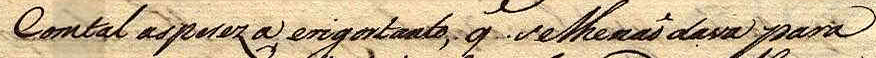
Com tal aspereza e rigor tanto, q̄ se lhe naõ dava para
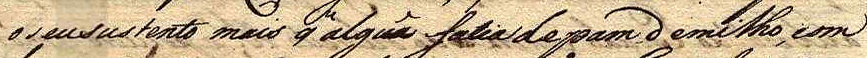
o seu sustento mais q̄ alguā fatia de pam de milho, com
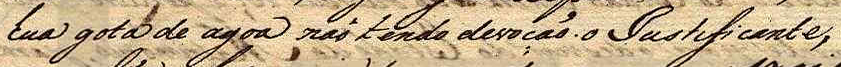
hua gota de agoa naõ tendo devoçaõ o Iustificante;
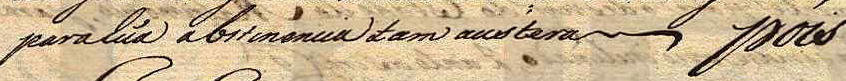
para hūa abstinencia tam austera pois
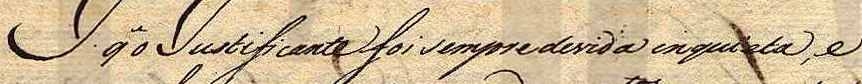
I q̄ o Iustificante foi sempre de vida inquieta, e
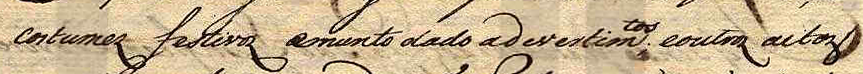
costumez festivoz a munto dado a devertim.tos; e outroz actoz
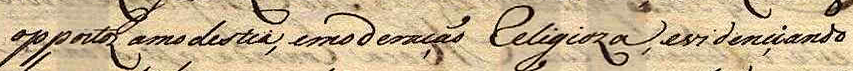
oppostoz a modestia, e moderaçaõ Religioza, evidençiando
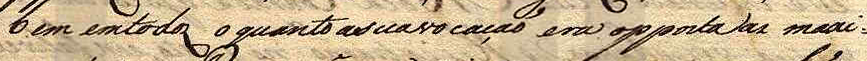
bem em todo o quanto a sua vocaçaõ era opposta as maxi
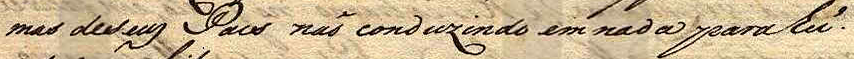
mas de seus Pais naõ conduzindo em nada para hū
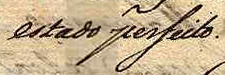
estado perfeito.
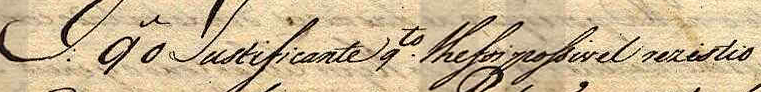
I. q̄ o Iustificante q.to lhe foi possivel rezistio
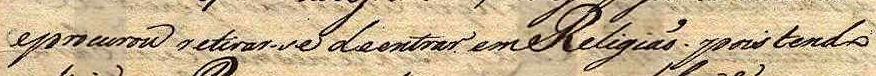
e procurou retirar-se de entrar em Religiaõ. pois tendo
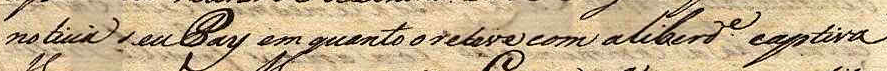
noticia seu Pay emquanto o reteve com a liberd.e captiva
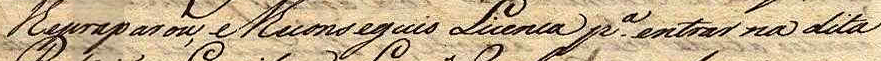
lhe praparou, e lhe conseguio Licenca p.a entrar na dita
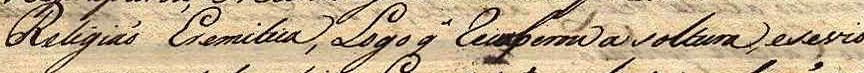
Religiaõ Eremitica, Logo q̄ Recuperou a soltura, e se vio
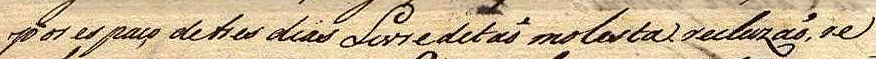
por espaço de tres dias Livre ditas molesta recluzaõ, re
